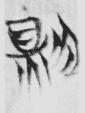則
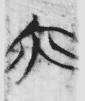亦
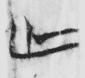亡
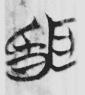䎽
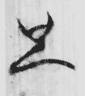也
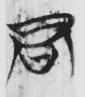君
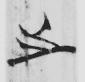之
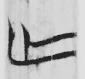亡
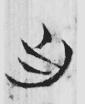出
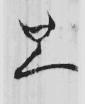也
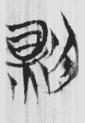則
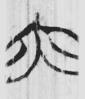亦
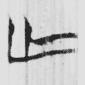亡
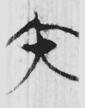內
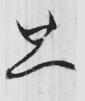也
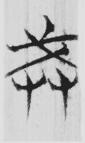戒
